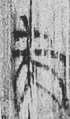夫
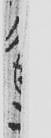○（咀）
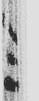之
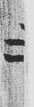又（有）
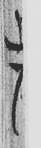未（味）
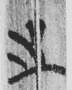之
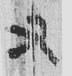又（有）
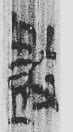鼓
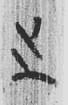之
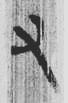又（有）
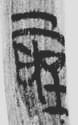聖（聲）
